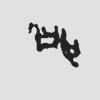神
